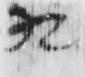九
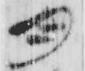月
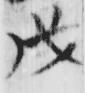戊
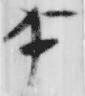午
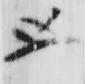之
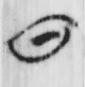日
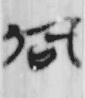卲
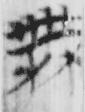無
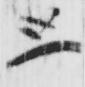之
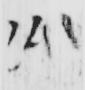州
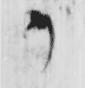人
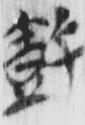鼓
